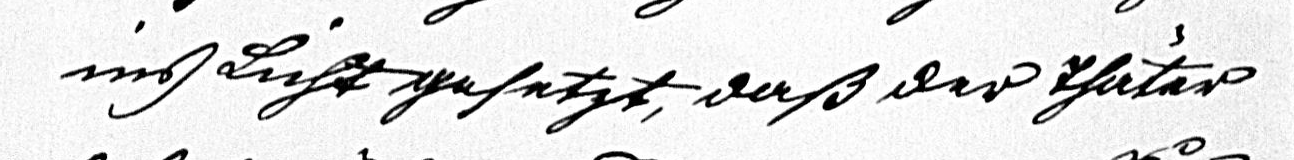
ins Licht gesetzt, daß der Thäter
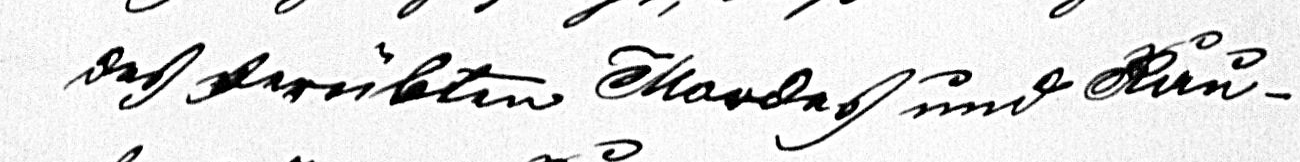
des verübten Mordes und Rau¬
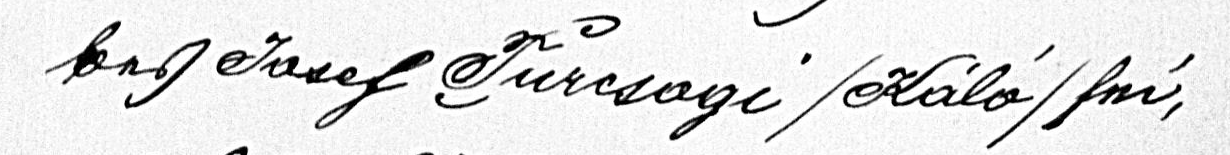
bes Josef Turcsogi/Káló/sei,
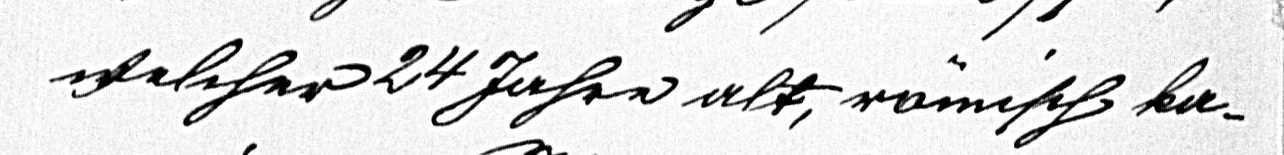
welcher 24 Jahre alt, römisch ka¬
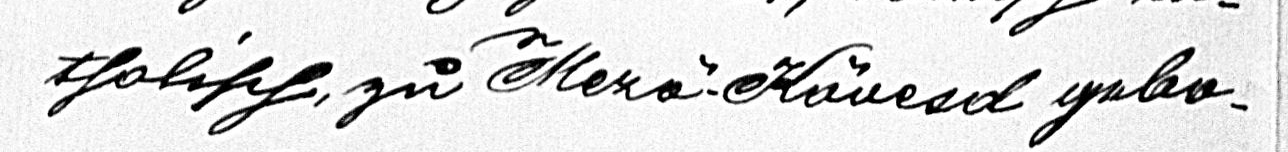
tholisch, zu Mezö-Kövesd gebo¬
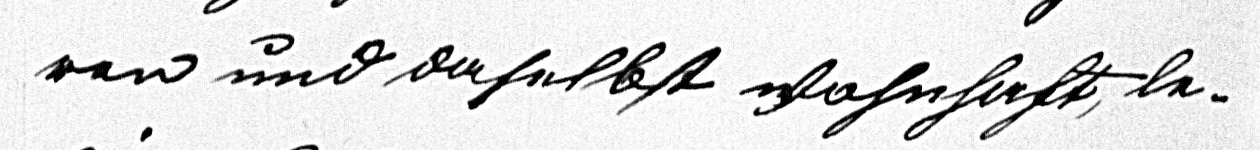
ren und daselbst wohnhaft, le¬
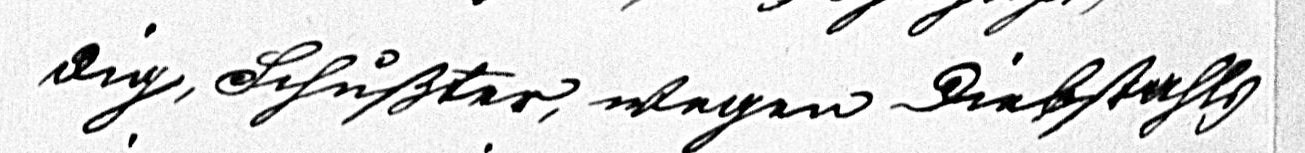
dig, Schußter, wegen Diebstahls
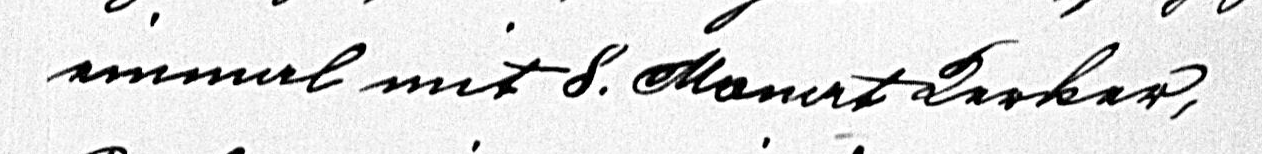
einmal mit 8. Monat Kerker,
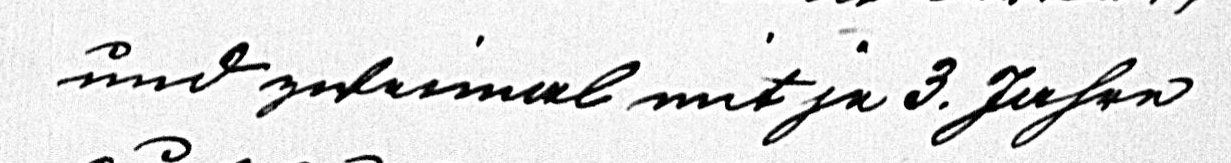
und zweimal mit je 3. Jahre
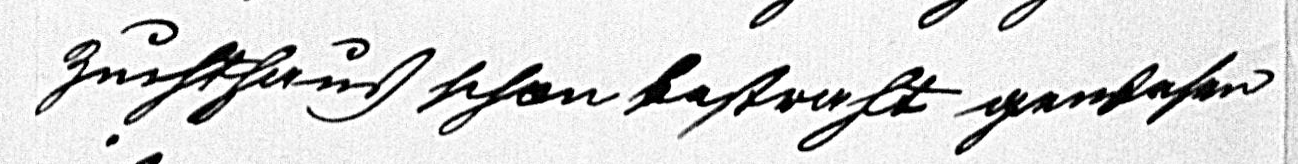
Zuchthaus schon bestraft gewesen
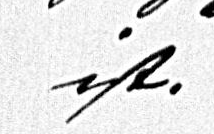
ist.
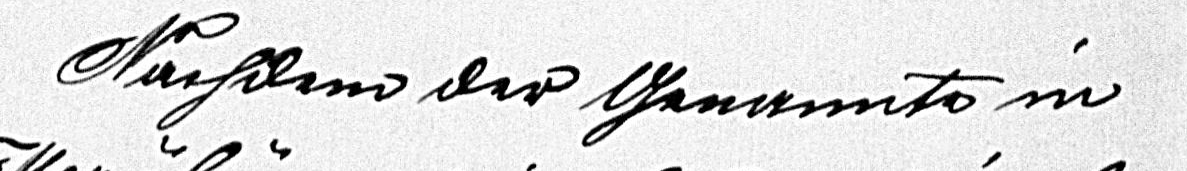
Nachdem der Genannte in
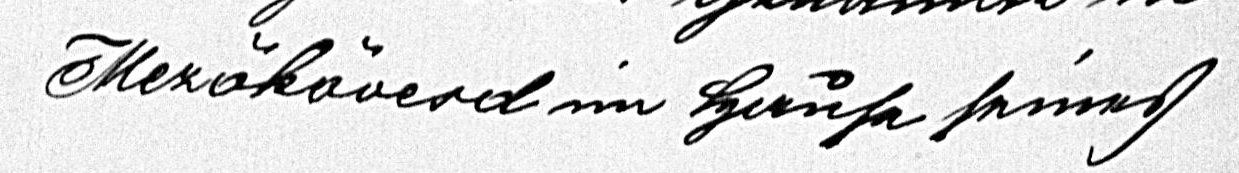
Mezökövesd im Hause seines
